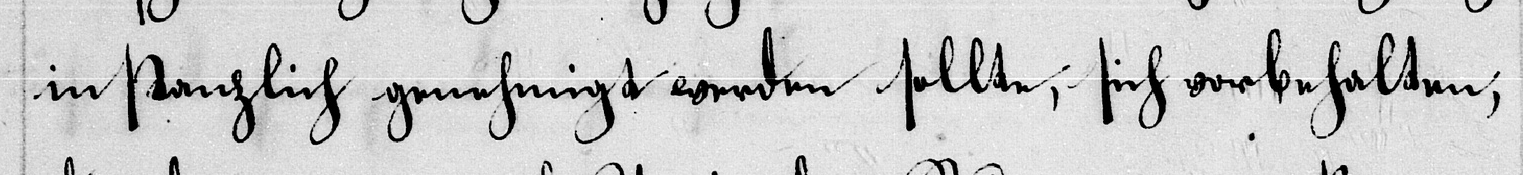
instanzlich genehmigt werden sollte, sich vorbehalten,
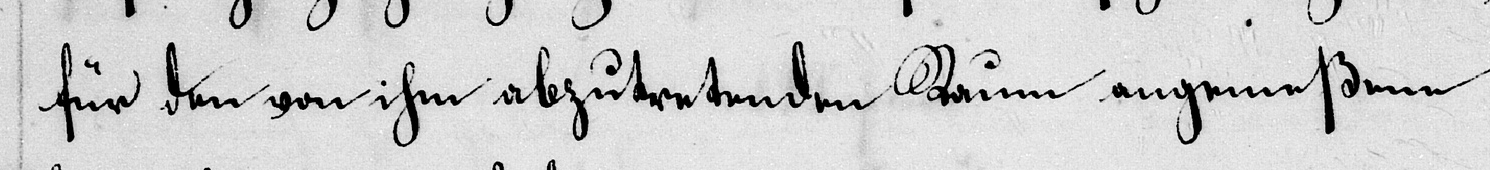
für den von ihm abzutretenden Raum angemeßene
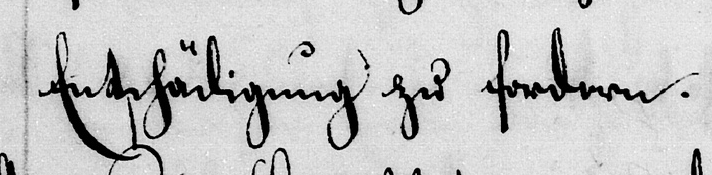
Entschädigung zu fordern.
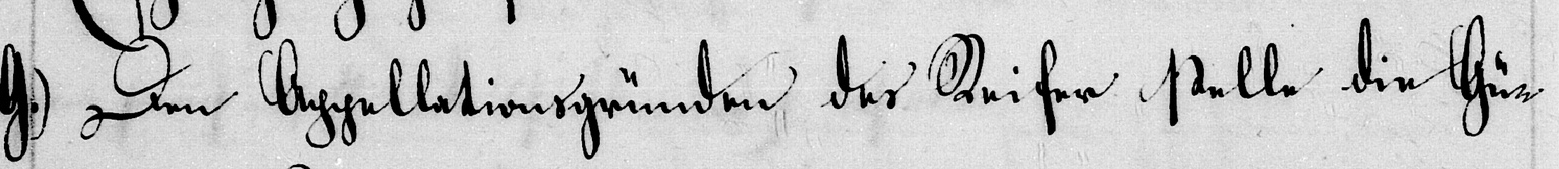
G.) Den Appellationsgründen des Reifer stelle die Gü¬
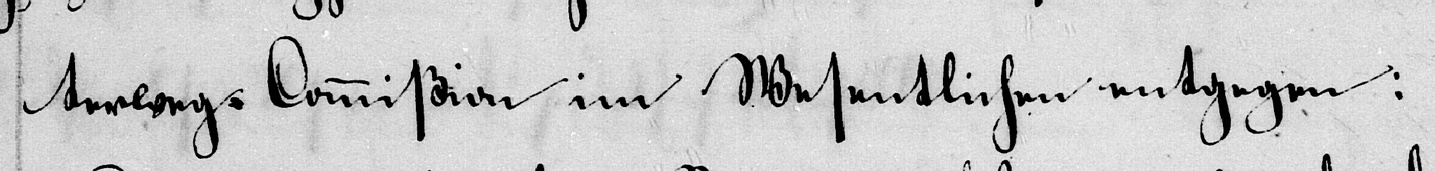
terweg-Commißion im Wesentlichen entgegen:
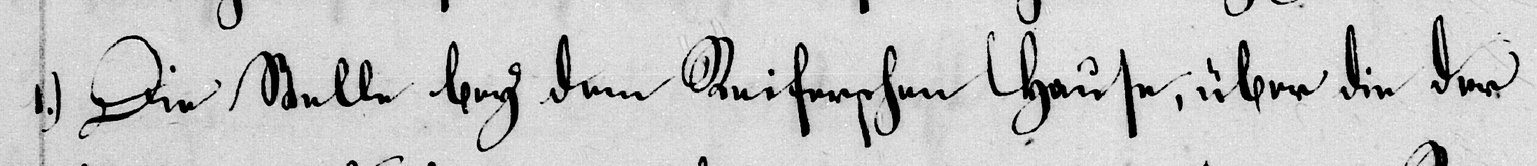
1.) Die Stelle bey dem Reiferschen Hause, über die der
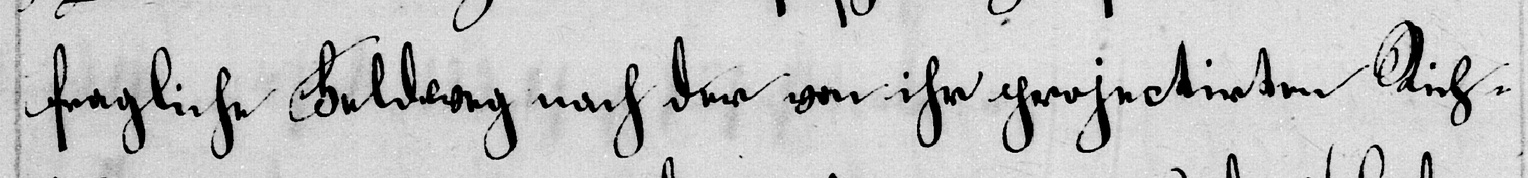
fragliche Feldweg nach der von ihr projectirten Rich¬
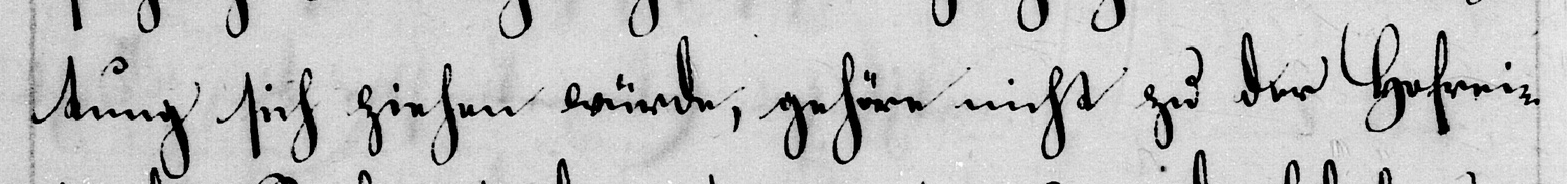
tung sich ziehen würde, gehöre nicht zu der Hofrei¬
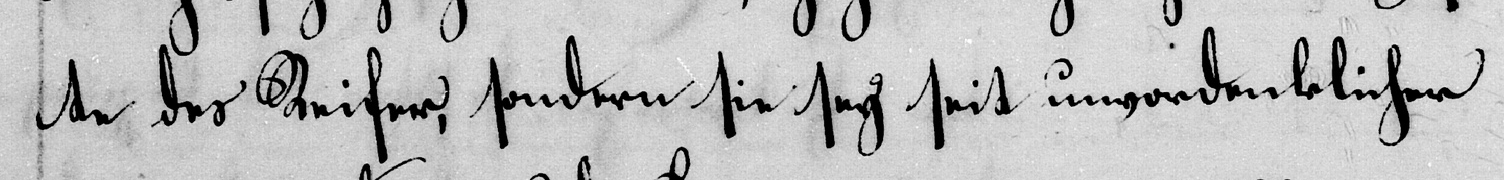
te des Reifer, sondern sie sey seit unvordenklicher
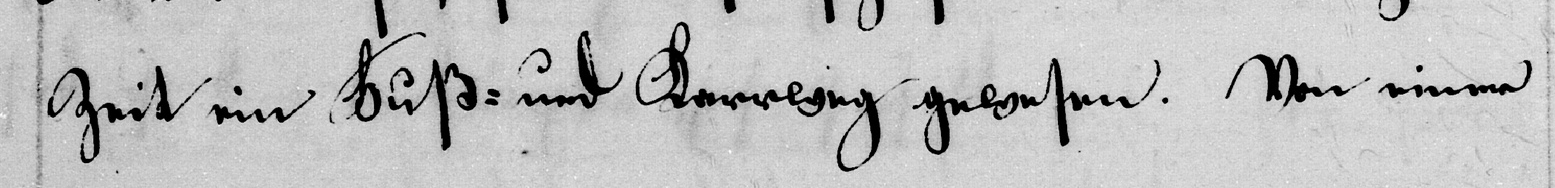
Zeit ein Fuß- und Karrenweg gewesen. Von einer
